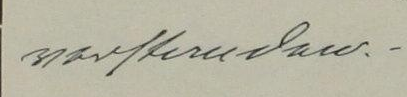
verstanden.
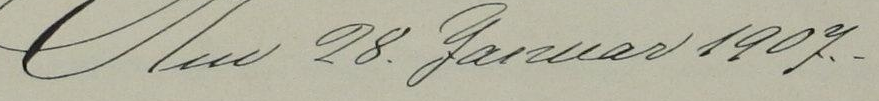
Am 28. Januar 1907.
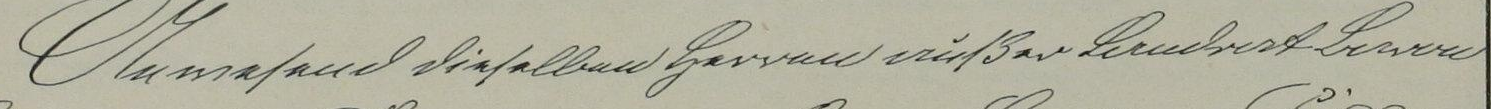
Anwesend dieselben Herren außer Landrat Baron
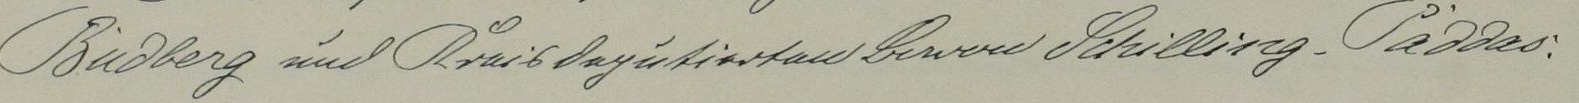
Budberg und Kreisdeputierten Baron Schilling-Paddas.
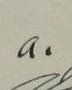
a.
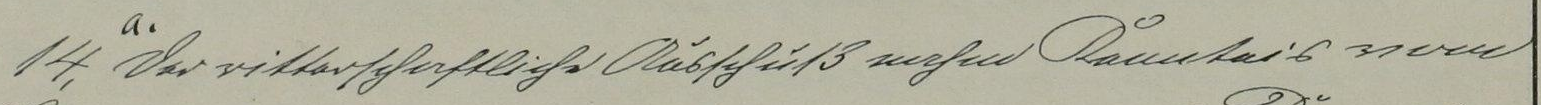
14. Der ritterschaftliche Ausschuß nahm Kenntnis vom
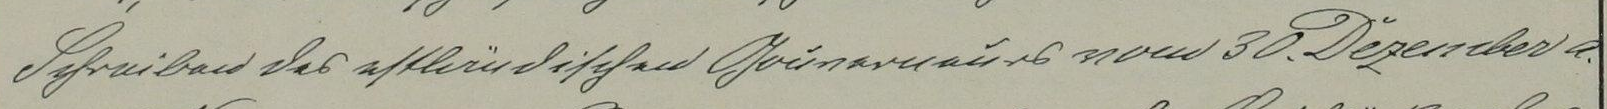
Schreiben des estländischen Gouverneurs vom 30. Dezember a.
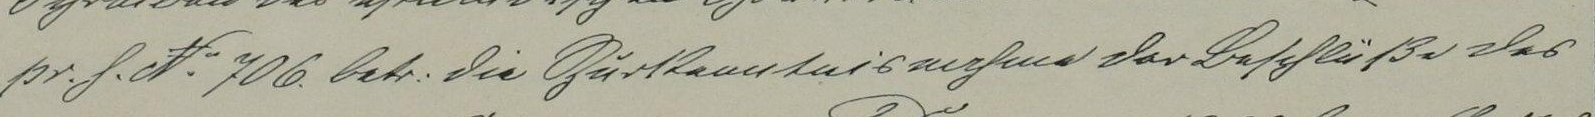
pr. s. No. 706. betr. die Zurkenntnisnahme der Beschlüße des
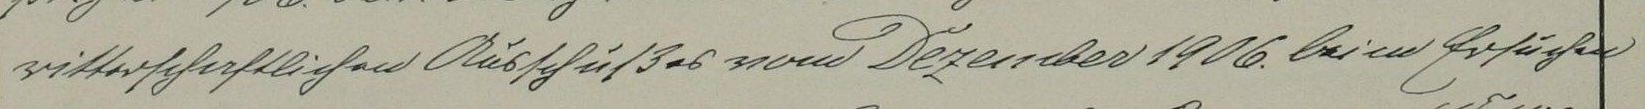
ritterschaftlichen Ausschußes vom Dezember 1906. beim Ersuchen
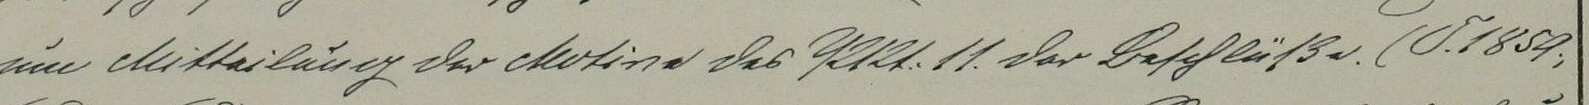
um Mitteilung der Motive des Pkt. 11. der Beschlüße. (T.1859;
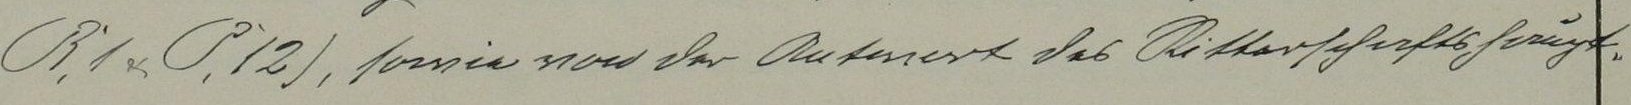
R1. & P.12), sowie von der Antwort des Ritterschaftshaupt-
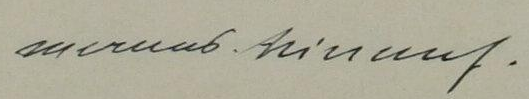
manns hierauf.
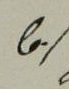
b.
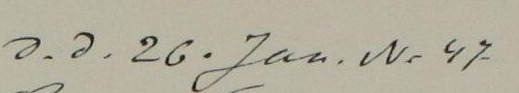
d.d. 26. Jan. Nr. 47
